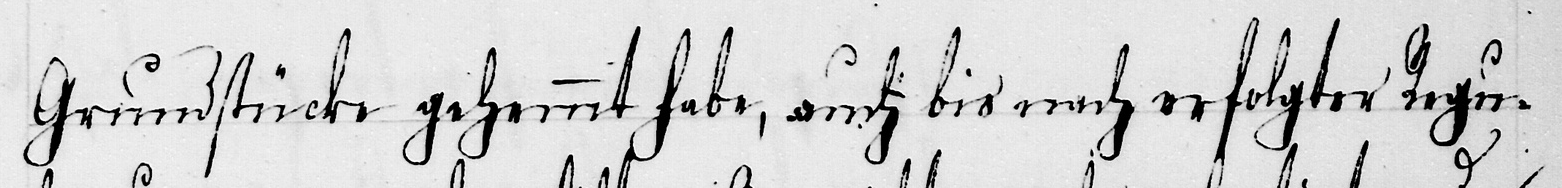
Grundstücke gehemmt habe, auch bis nach verfolgter Regu¬
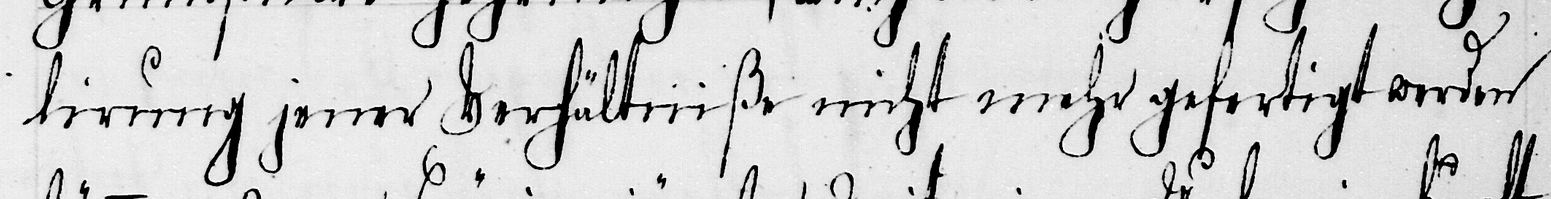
lirung jener Verhältniße nicht mehr gefertigt werden
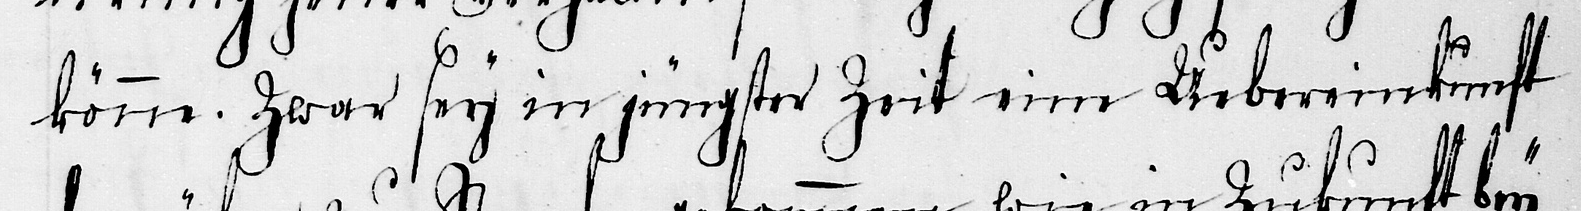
könne. Zwar sey in jüngster Zeit eine Uebereinkunft
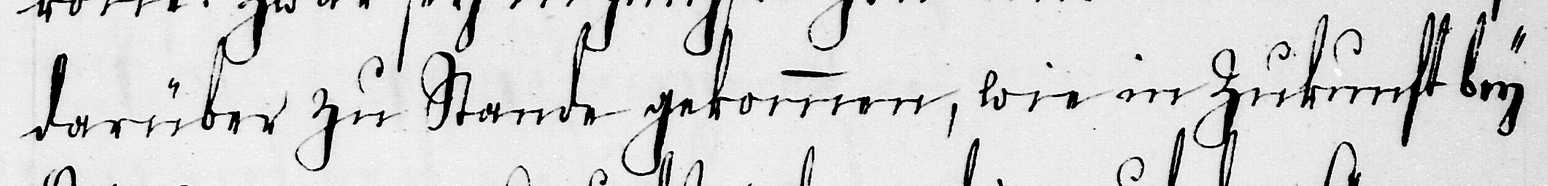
darüber zu Stande gekommen, wie in Zukunft bey
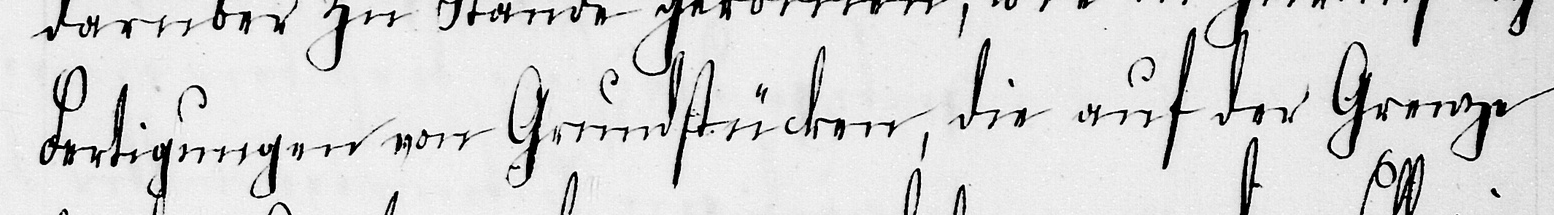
Fertigungen von Grundstücken, die auf der Grenze
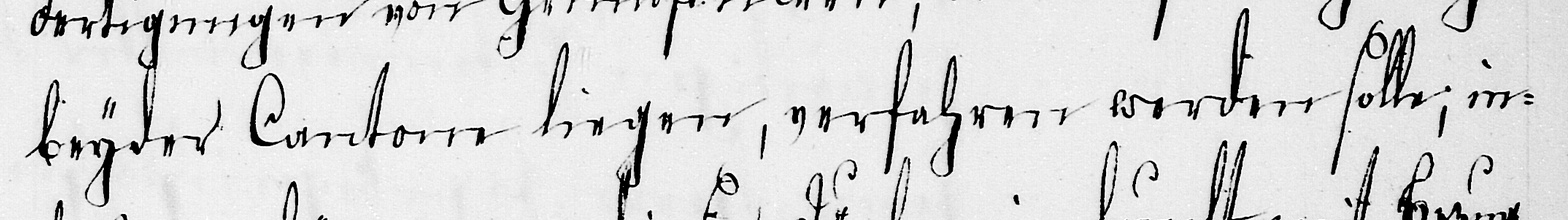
beyder Cantone liegen, verfahren werden solle, in¬
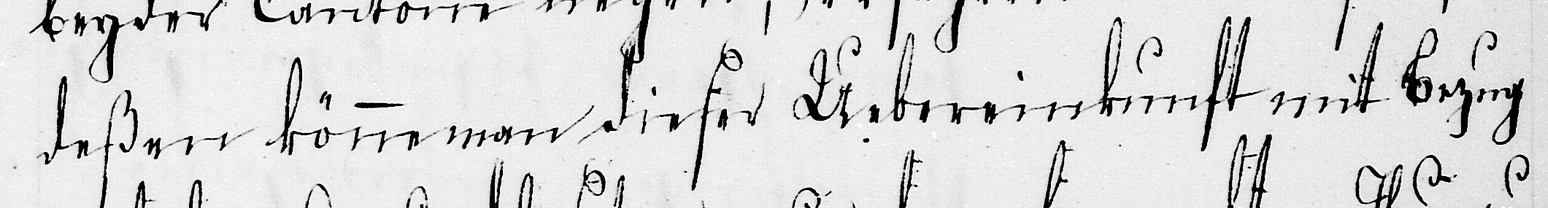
deßen könne man dieser Uebereinkunft mit Bezug
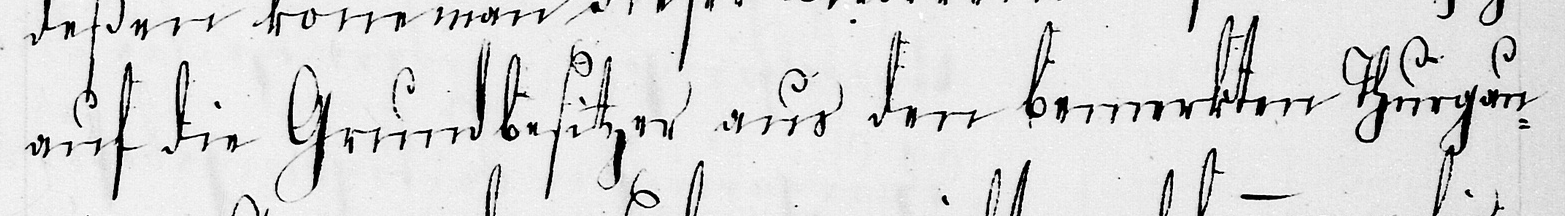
auf die Grundbesitzer aus den bemerkten Thurgau¬
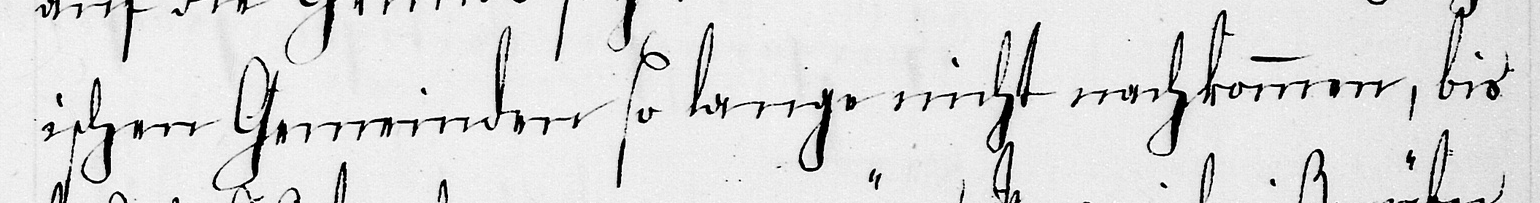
ischen Gemeinden so lange nicht nachkommen, bis
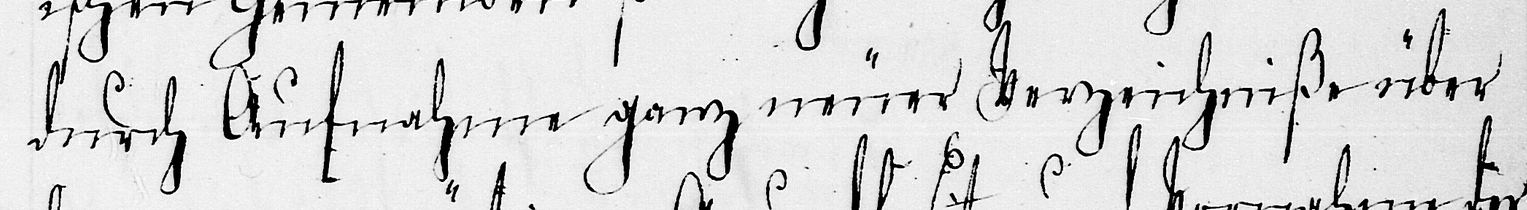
durch Aufnahme ganz neuer Verzeichniße über
